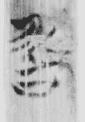敢
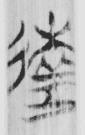{止達}
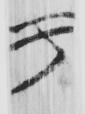于
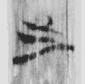之
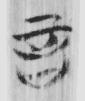言
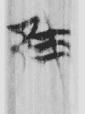隹
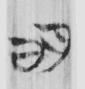明
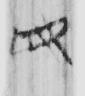母
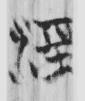淫
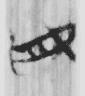母
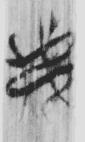弗
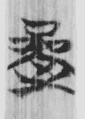{厽室}
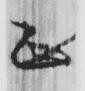𠀠
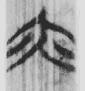亦
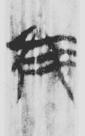隹
